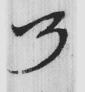乃
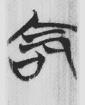命
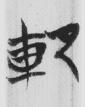{車㔾}
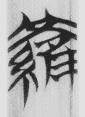羅
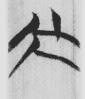太
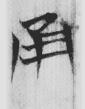甬
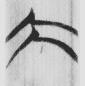大
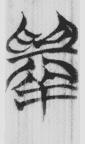鬲
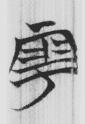𩁹
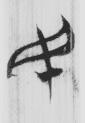民
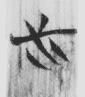必
